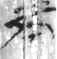不
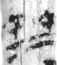竺（築）
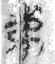東
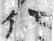北
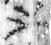之
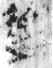遇（寓）
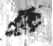西
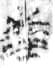南
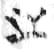之
